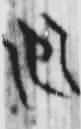州
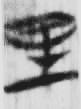里
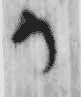人
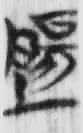○（陽）
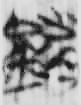鎆
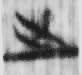之
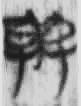與
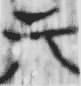亓（其）
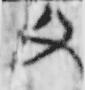父
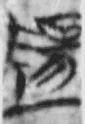○（陽）
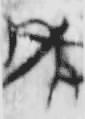年
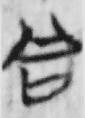同
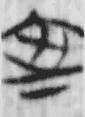室
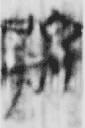與
